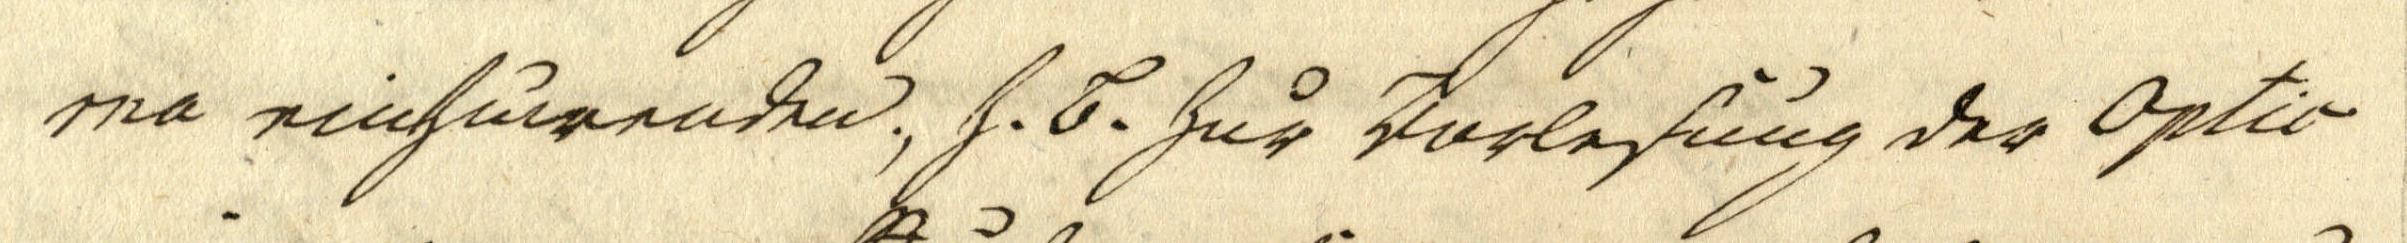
ma einzuwenden, z. B. zur Vorlesung der Optic
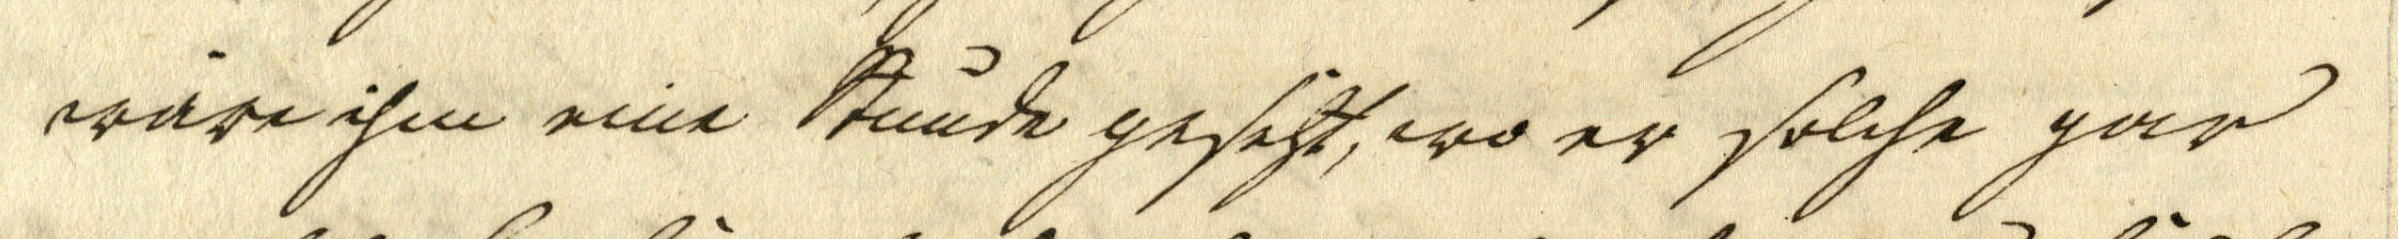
wäre ihm eine Stunde gesetzt, wo er solche gar
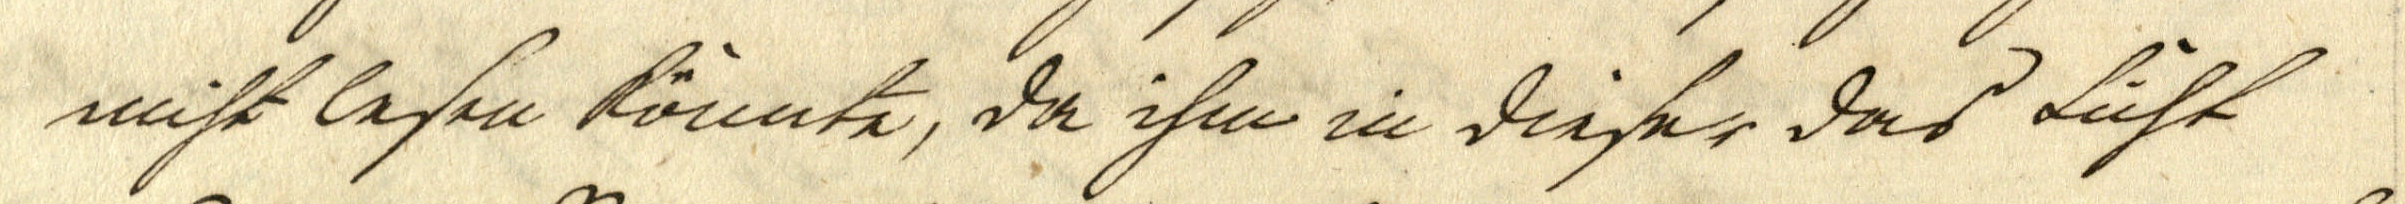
nicht lesen könnte, da ihm in dieser das Licht
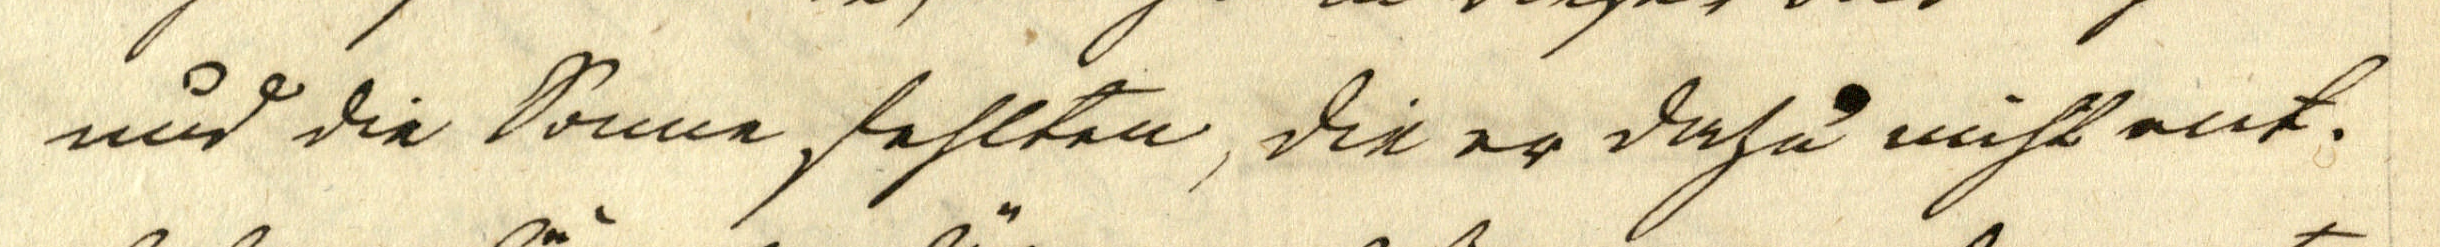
und die Sonne fehlten, die er dazu nicht ent-
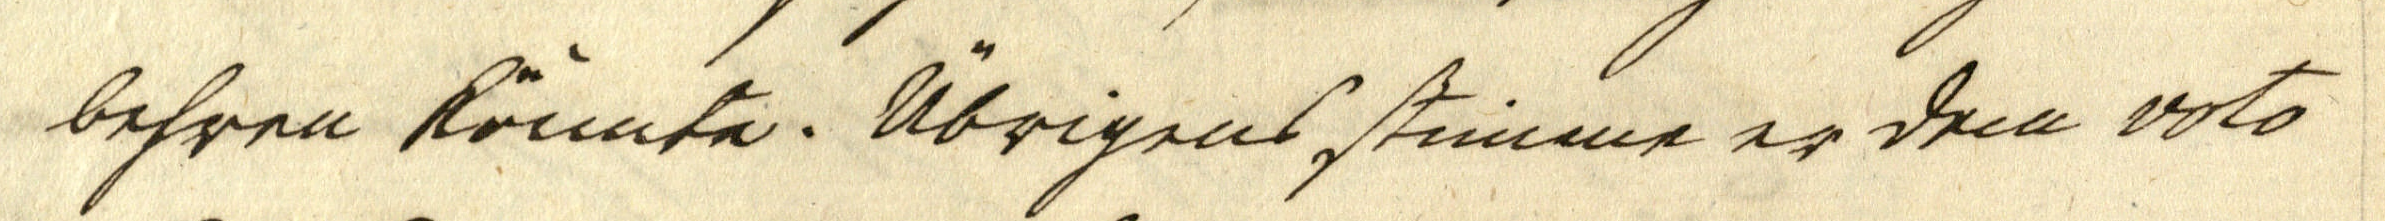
behren könnte. Übrigens stimme er dem voto
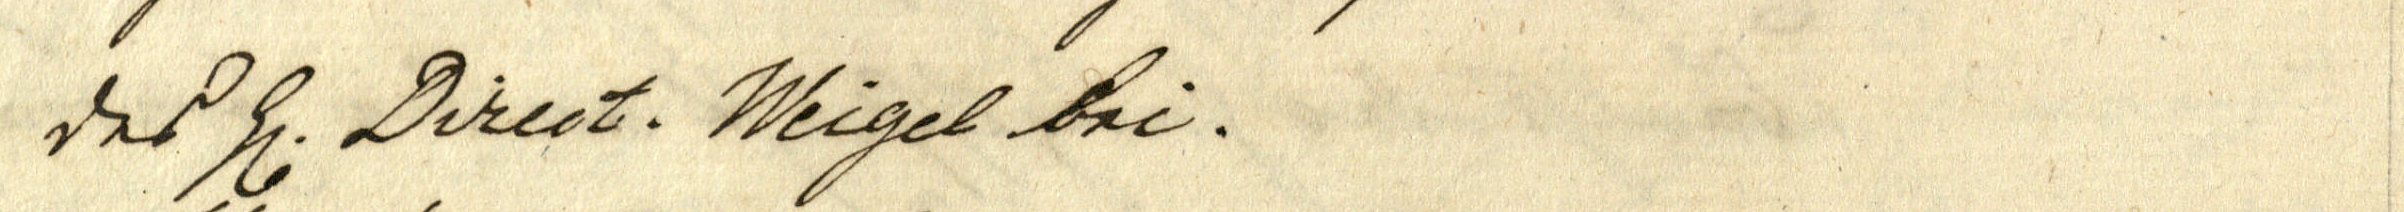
des H. Direct. Weigel bei.
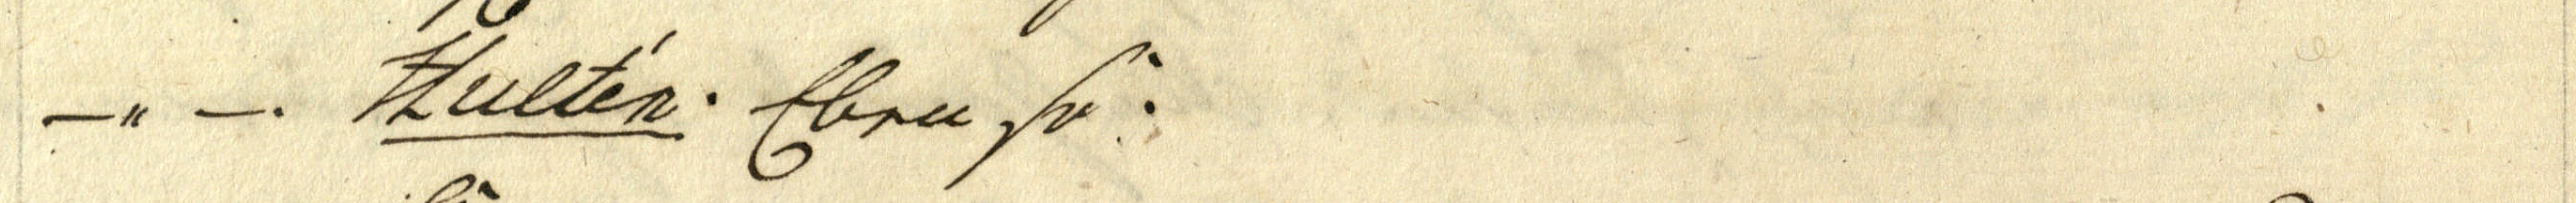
- " - Hultén. Eben so.
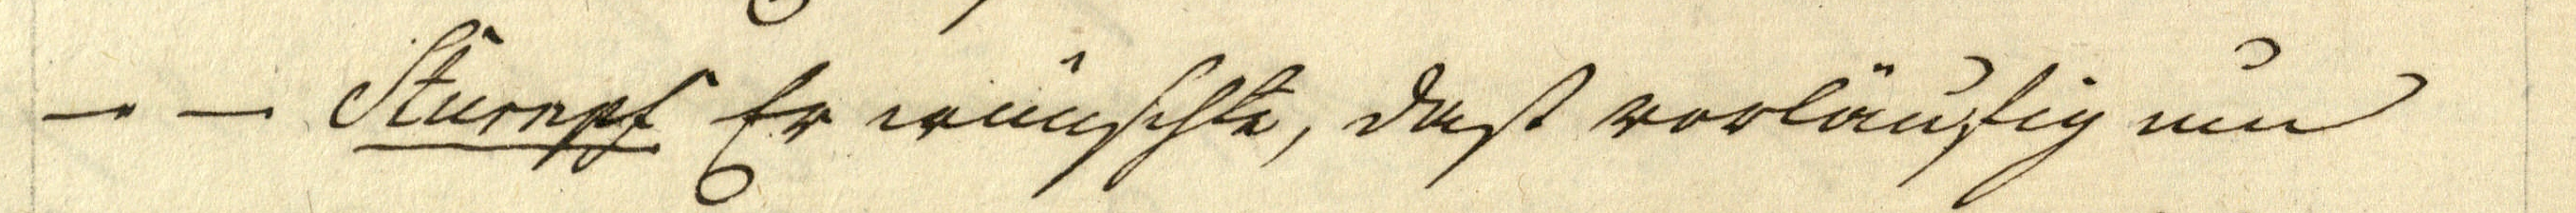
- " - Stumpf. Er wünschte, daß vorläufig um
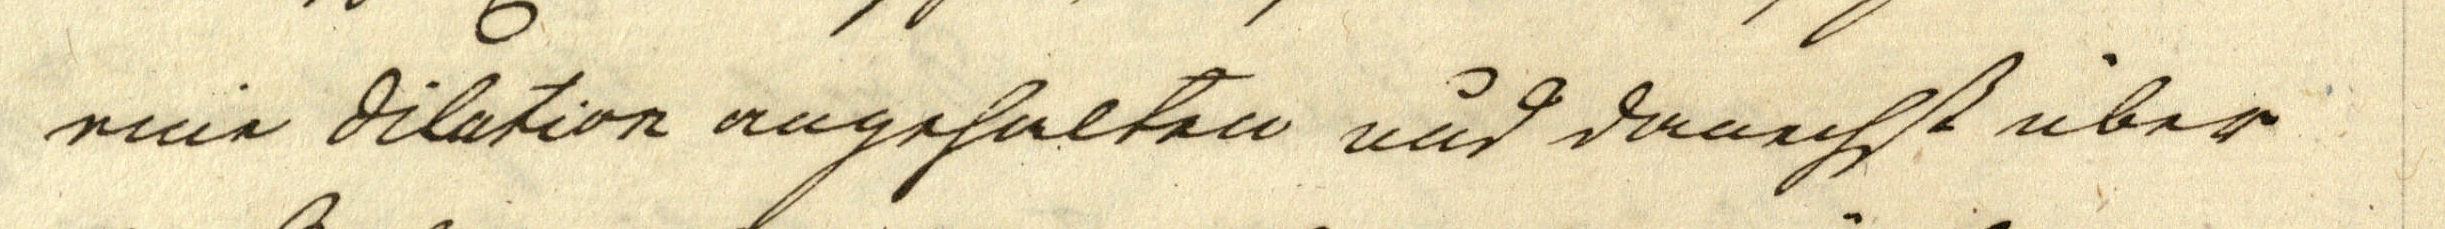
eine Dilation angehalten und danechst über
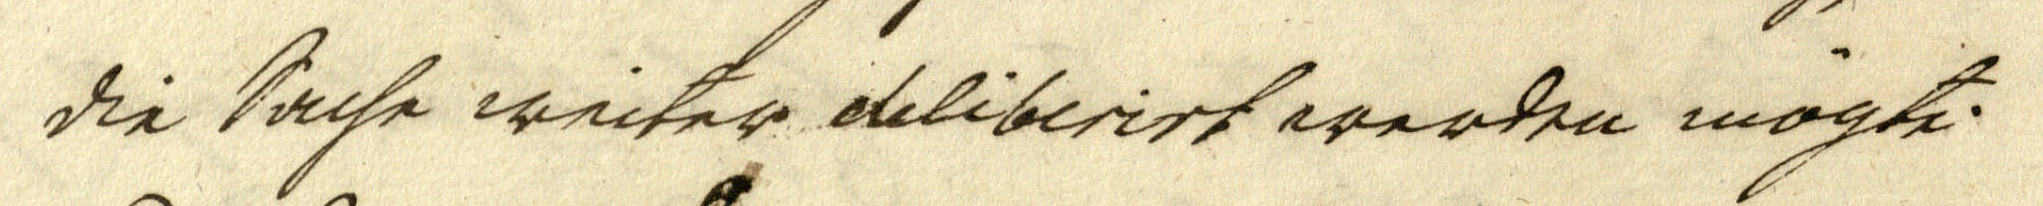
die Sache weiter deliberirt werden mögte.
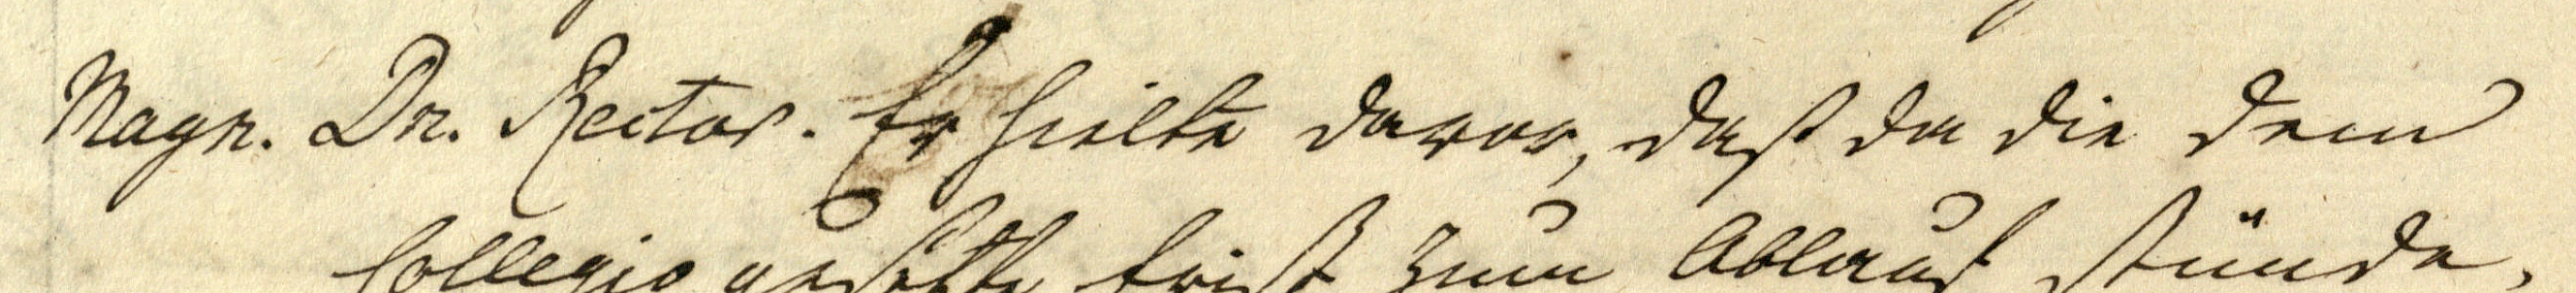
Magn. Dn. Rector. Er hielte davor, daß da die dem
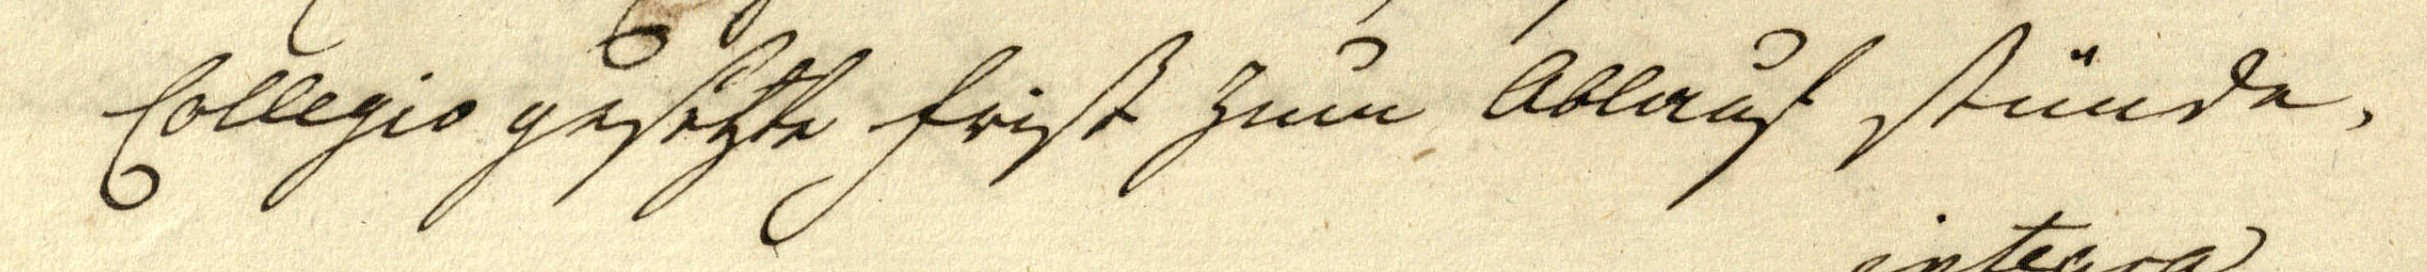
Collegio gesetzte Frist zum Ablauf stünde,
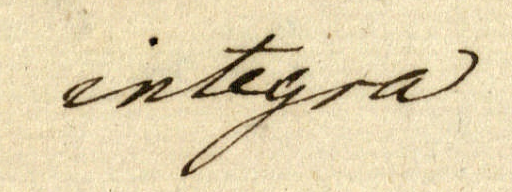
integra
